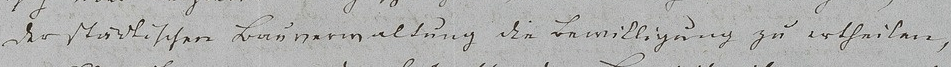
der städtischen Bauverwaltung die Bewilligung zu ertheilen,
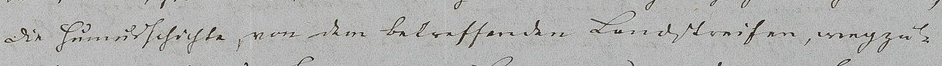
die Humusschichte, von dem betreffenden Landstreifen, wegzu-
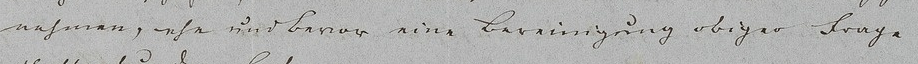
nehmen, ehe und bevor eine Bereinigung obiger Frage
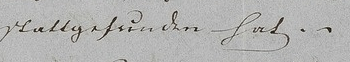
stattgefunden hat. –
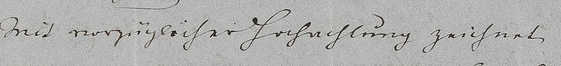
Mit vorzüglicher Hochachtung zeichnet
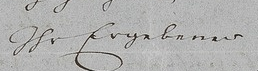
Ihr Ergebener
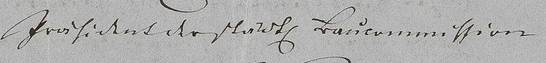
Präsident der städtischen Baucommission
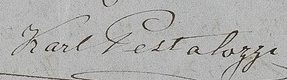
Karl Pestalozzi
